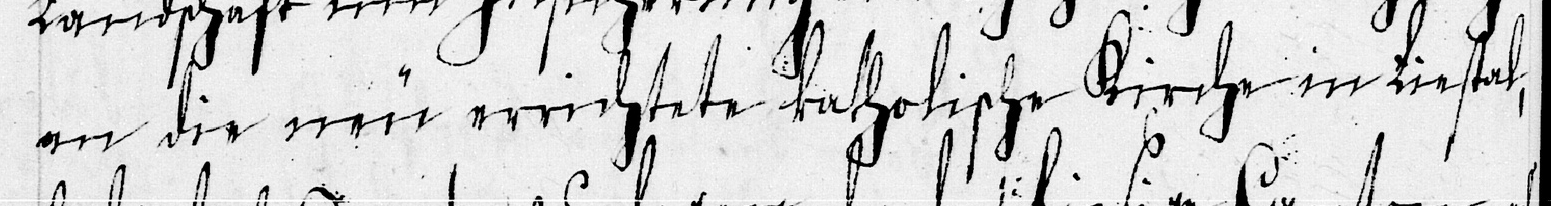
an die neu errichtete katholische Kirche in Liestal,
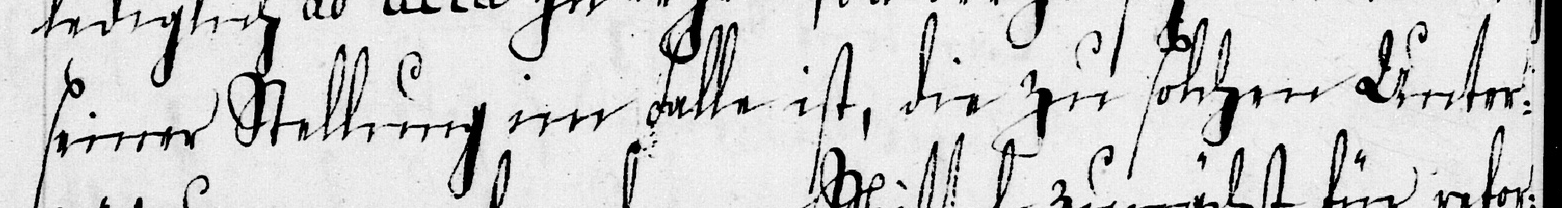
seiner Stellung im Falle ist, die zu solchen Unter¬
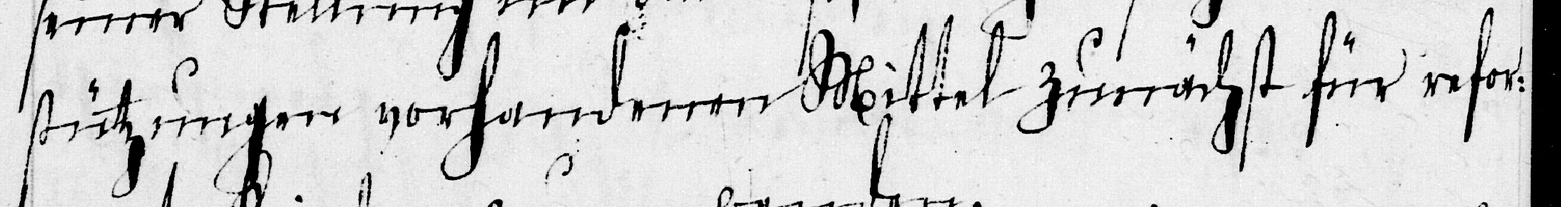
stützungen vorhandenen Mittel zunächst für refor¬
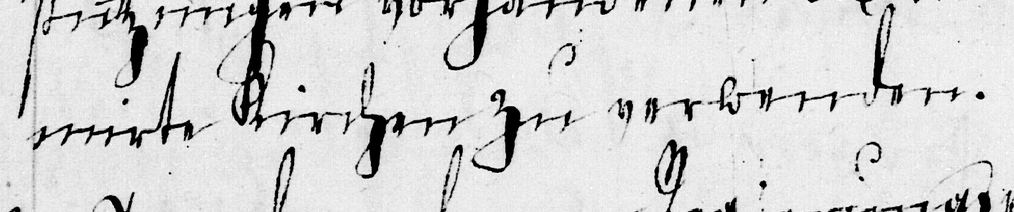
mirte Kirchen zu verwenden.
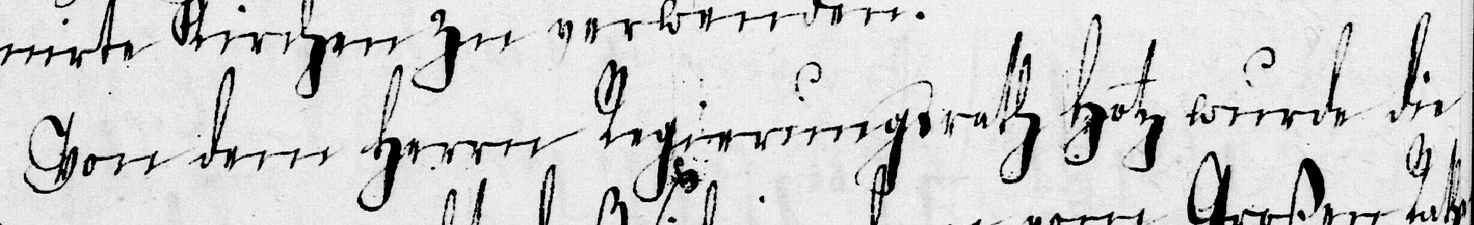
Von dem Herrn Regierungsrath Hotz wurde die
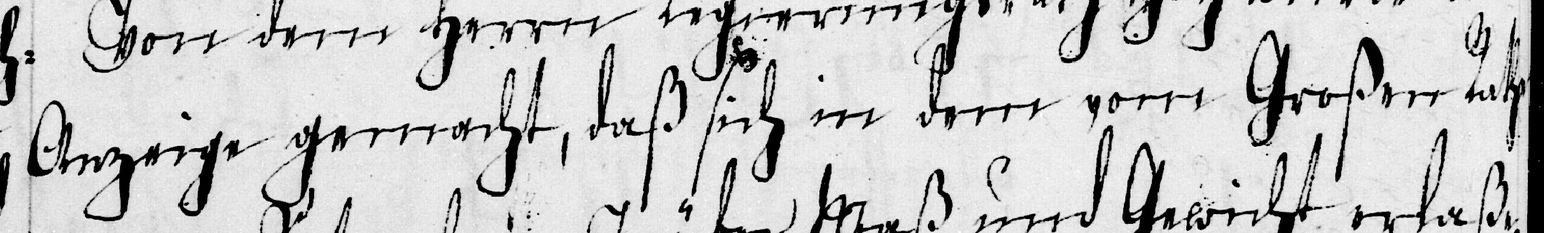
Anzeige gemacht, daß sich in dem vom Großen Rathe
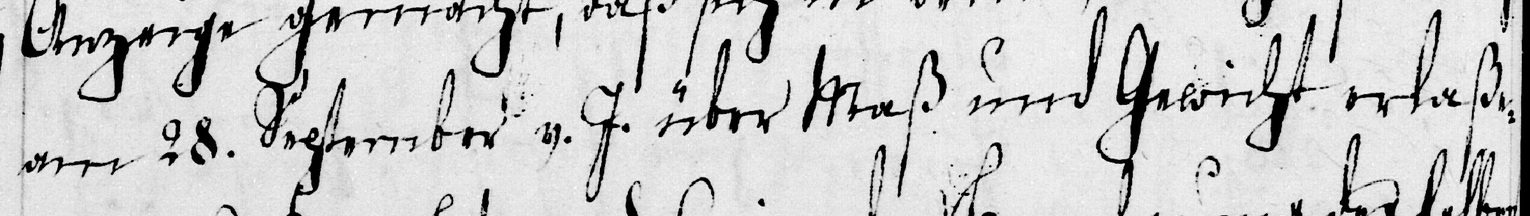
am 28. September v. J. über Maß und Gewicht erlaße¬
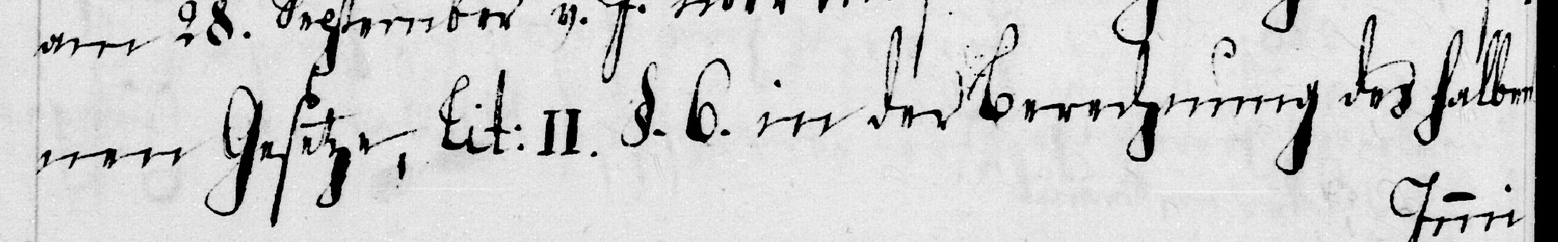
nen Gesetze, lit: II. §. 6. in der Berechnung des halben
